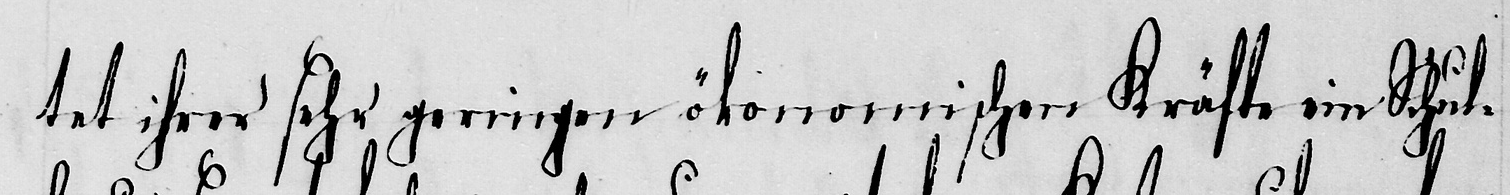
tet ihrer sehr geringen ökonomischen Kräfte ein Schul¬
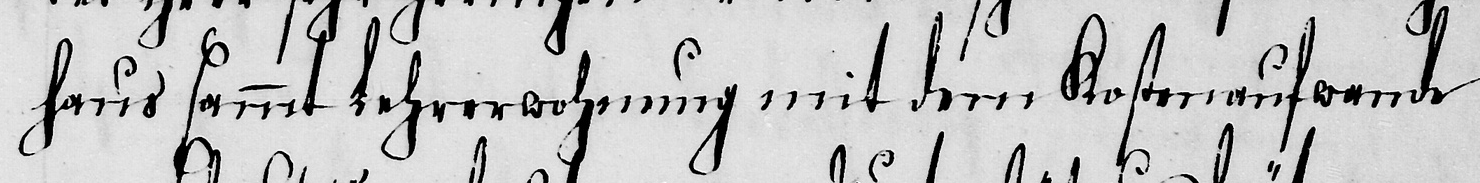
haus sammt Lehrerwohnung mit dem Kostenaufwande
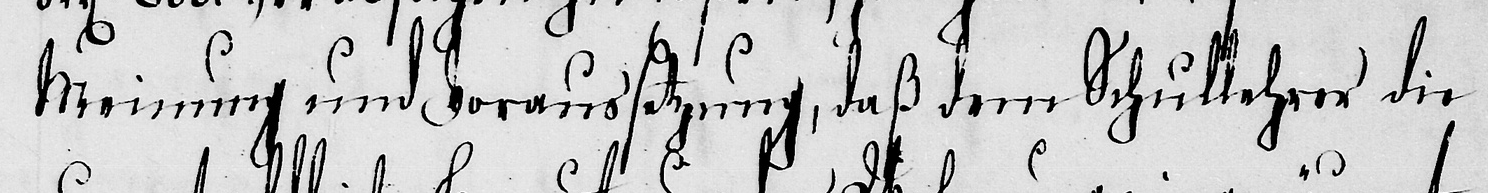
Meinung und Voraussetzung, daß dem Schullehrer die
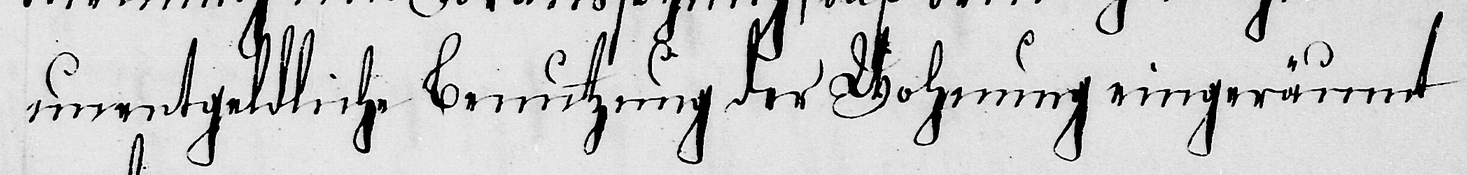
unentgeldliche Benutzung der Wohnung eingeräumt
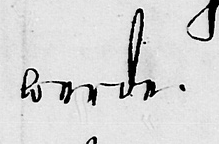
werde.
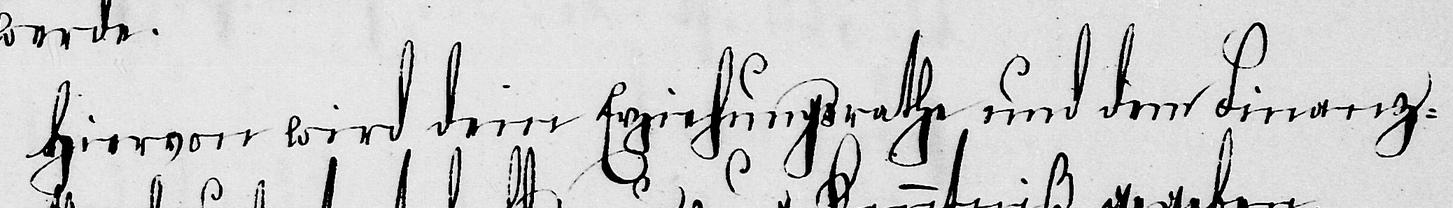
Hiervon wird dem Erziehungsrathe und dem Finanz¬
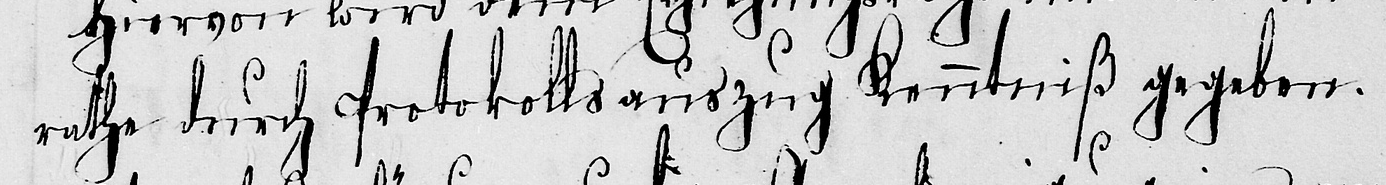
rathe durch Protokollsauszug Kenntniß gegeben.
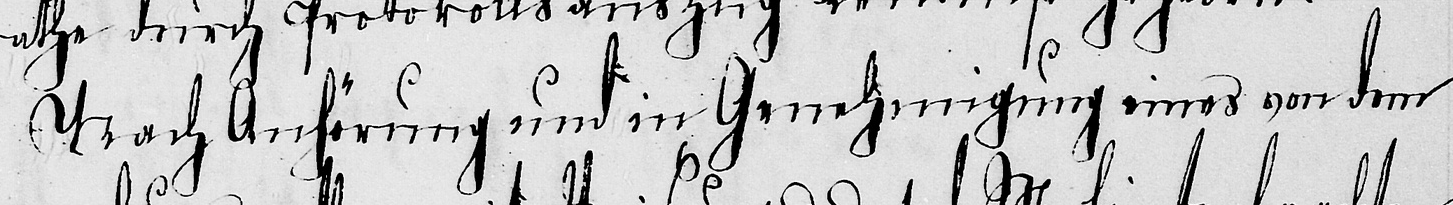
Nach Anhörung und in Genehmigung eines von dem
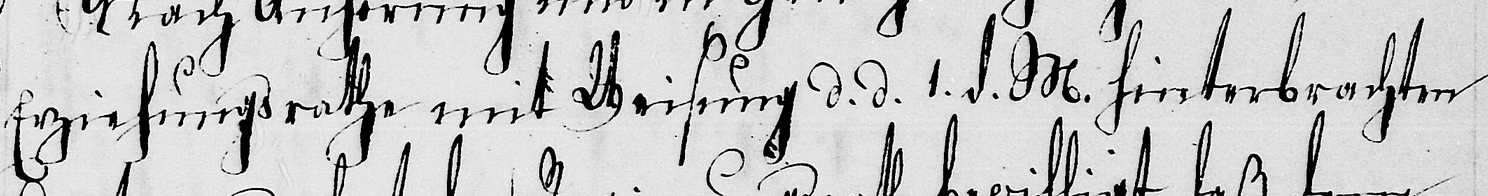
Erziehungsrathe mit Weisung d. d. 1. d. M. hinterbrachten
